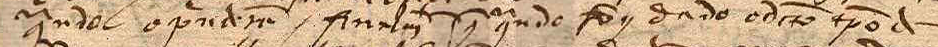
q̄ndo o p̄nderā / finalmte q̄ q̄ndo foy dado o dc̄to tp̄o de
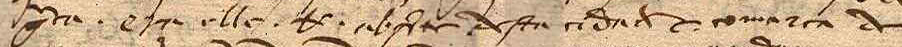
ḡça. era elle R. absēte desta cidade e comarca de
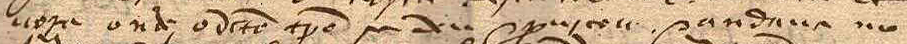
uora onde o dc̄to tp̄o se deu e ꝓujcou e andaua no
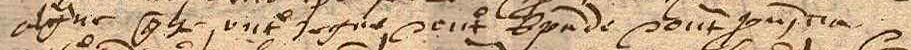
alḡue q̄ he outo regno e outo bpādo e out̄ ꝓuj̄cia e
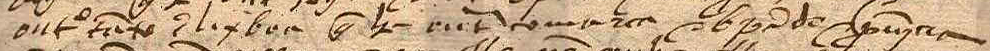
outo tāto ē lixboa q̄ he out̄ comarca e bpādo e ꝓuj̄cia
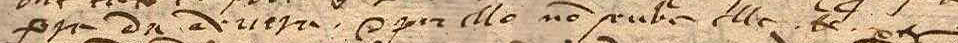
fora da deuora. e por ello n̄o soube elle R. ꝑte
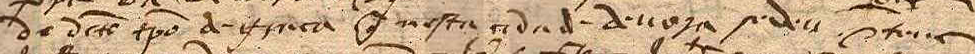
do dc̄to tpō de graça q̄ nesta cidade deuora se deu e teue
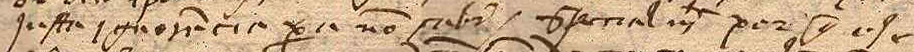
Justa jgnorācia ꝑa nō sabr̄ / especialmte porq̄ oJe
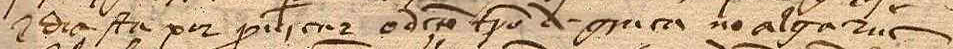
ē dia sta por ꝓujcar o dc̄to tp̄o de graça no algarue
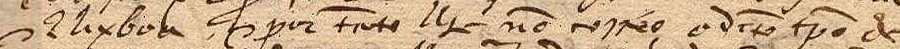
e ē lixboa. e portāto lhe n̄o correo o dc̄to tp̄o de
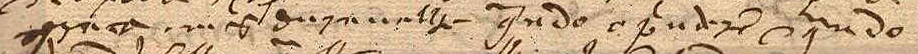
graça. mas duraualhe q̄ndo o p̄nderō e q̄ndo
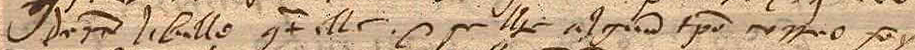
derā libello ꝯt̄ elle e se lhe alguū tp̄o correo foy
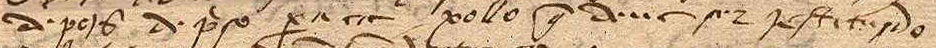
depojs de p̄so ꝑa ca pollo q̄ deue ser restitujdo
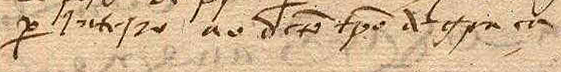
ꝑ Jntejro ao dc̄to tp̄o de graça
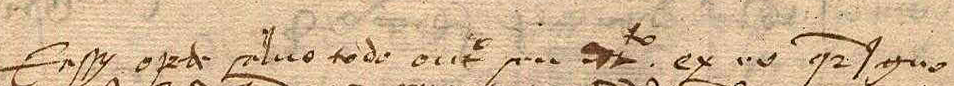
E assy o pede saluo todo outo seu dirto ex eo q̄r Jgno
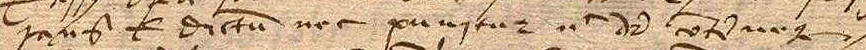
rans e dictū nec punjtur nc dr̄ c̄otēnere.
